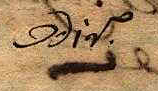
o dir.o
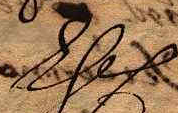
E se C.
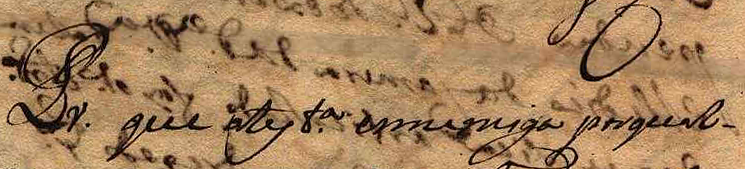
Pr. que a test.a ennemiga por qual
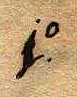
1.o
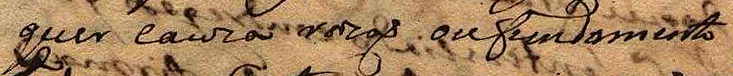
quer cauza razaõ ou fundamento
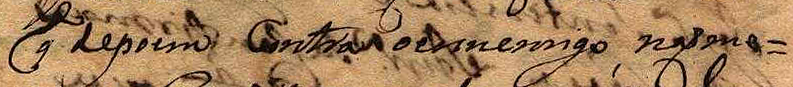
q̄ depoem Contra o ennemigo, naõ me
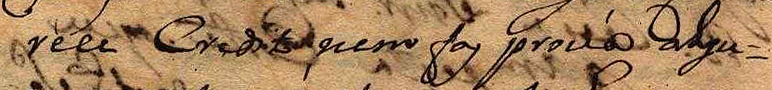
rece Credito, nem foy proua algu
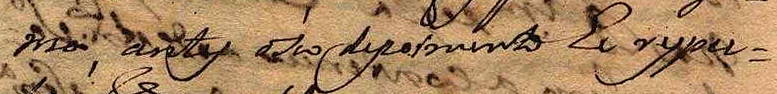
ma; antes o seo depoimento he respec
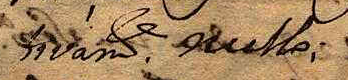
tivam.te nullo;
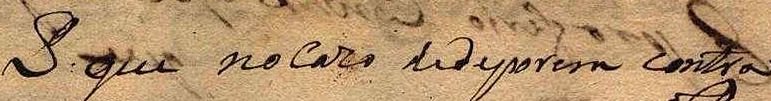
P. que no cazo de deporem contra
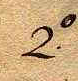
2.a
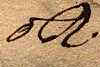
o R.
